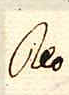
Reo
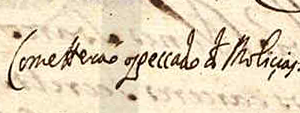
Cometteraõ o peccado d̄ Molicias
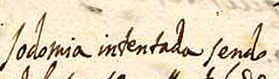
Sodomia intentada sendo
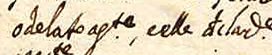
o delato ag.te, e elle d̄clar.te
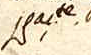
pac.te
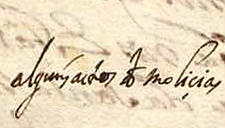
algun̄s actos d̄ molicias
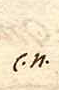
c.n.
